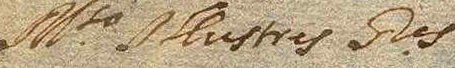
M.to Illustres S.res
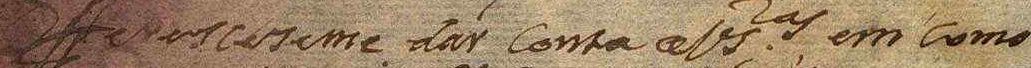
Offeresceseme dár conta a Vs.ras em como
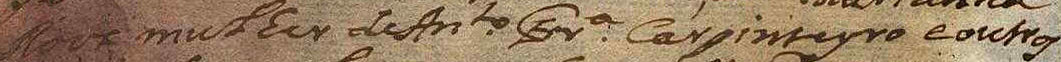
Roiz mulher de An.to Fr.a Carpinteyro e outros
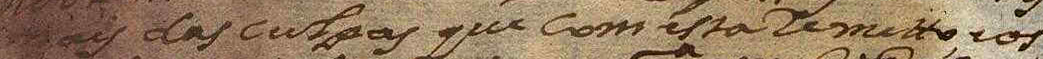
ais das culpas que com esta Remetto, e os
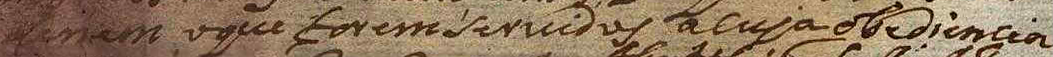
denem o que forem seruidos a cuja obediencia
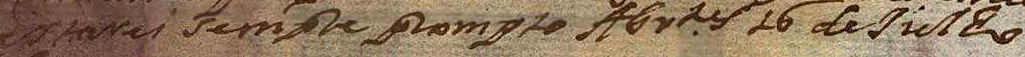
estarei sempRe pRompto Abr.tes 16 de Iulho
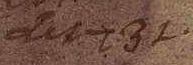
de 1731.
